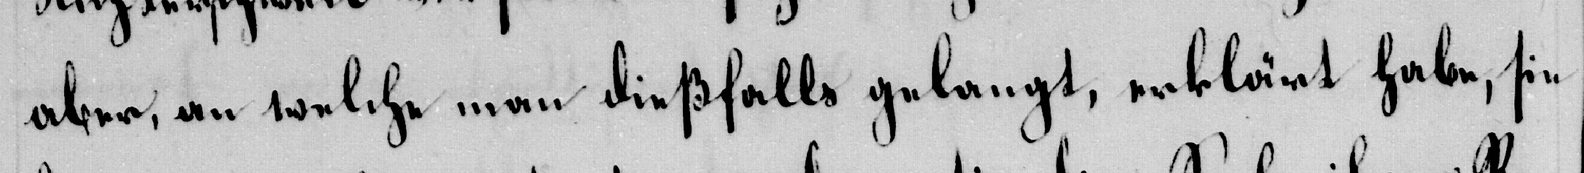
aber, an welche man dießfalls gelangt, erklärt habe, sie
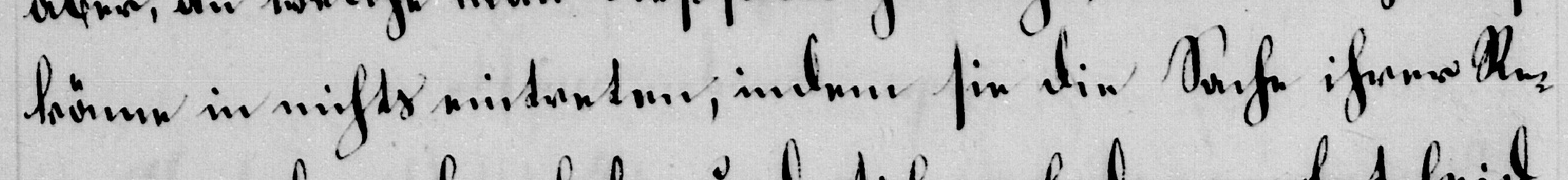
könne in nichts eintreten, indem sie die Sache, ihrer Re¬
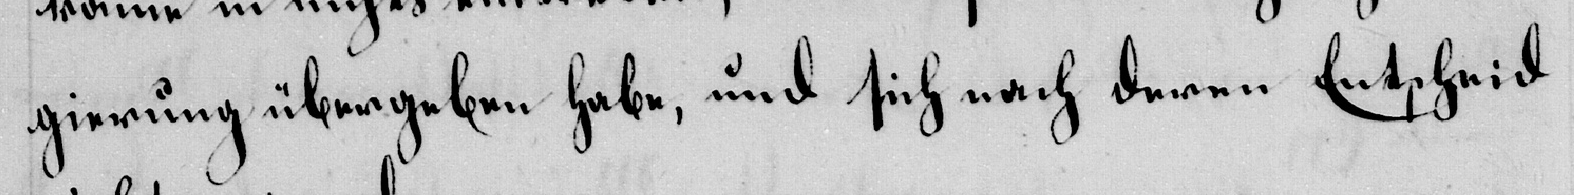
gierung übergeben habe, und sich nach deren Entscheid
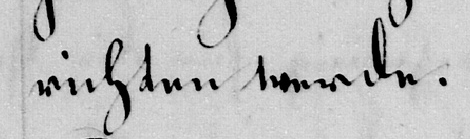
richten werde.
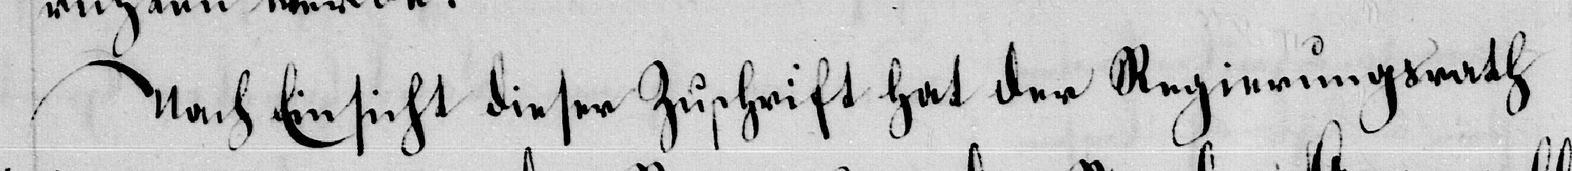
Nach Einsicht dieser Zuschrift hat der Regierungsrath
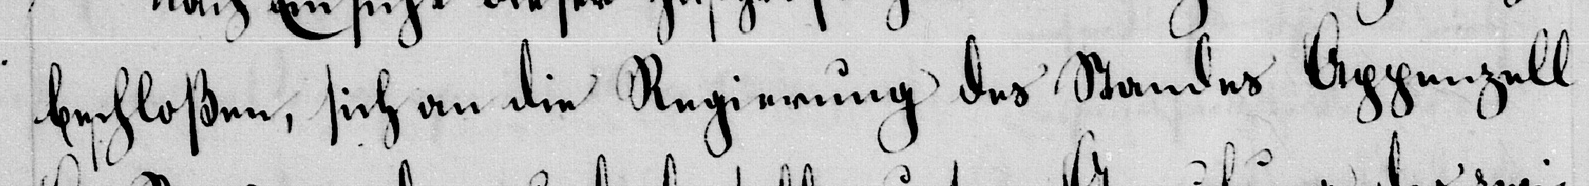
beschloßen, sich an die Regierung des Standes Appenzell
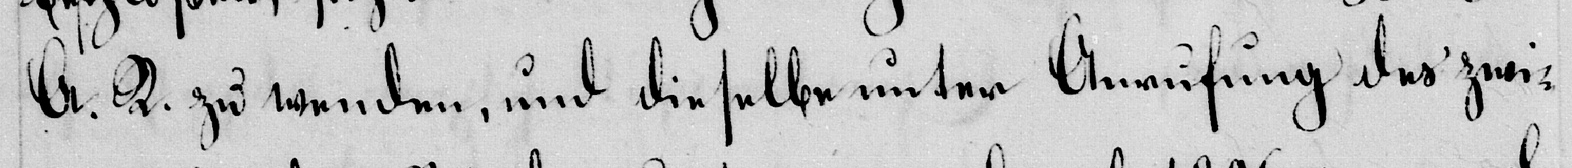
A. R. zu wenden, und dieselbe unter Anrufung des zwi¬
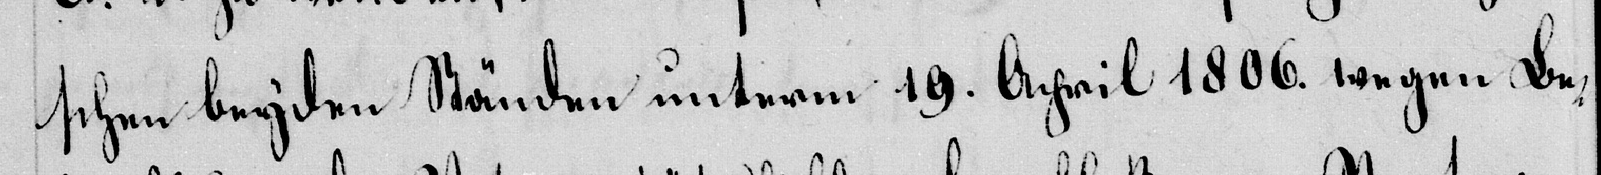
schen beyden Ständen unterm 19. April 1806. wegen Be¬
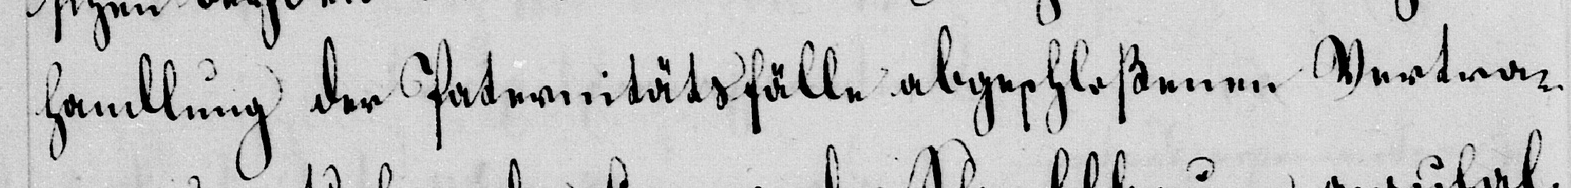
handlung der Paternitätsfälle abgeschloßenen Vertra¬
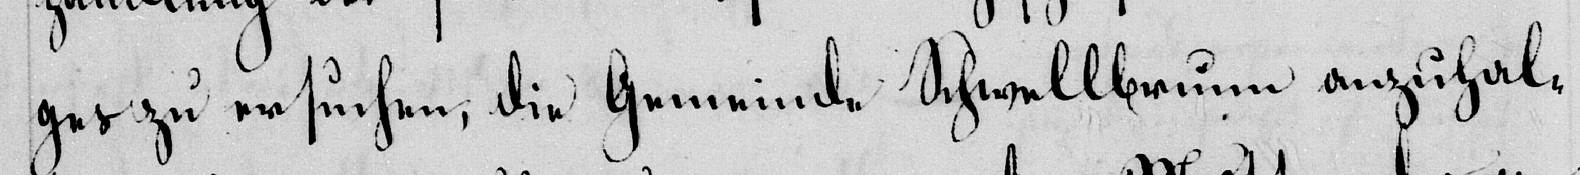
ges zu ersuchen, die Gemeinde Schwellbrunn anzuhal¬
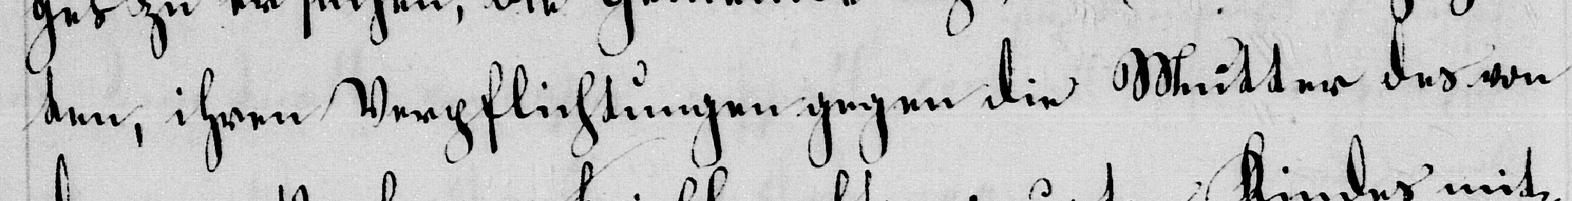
ten, ihren Verpflichtungen gegen die Mutter des von
